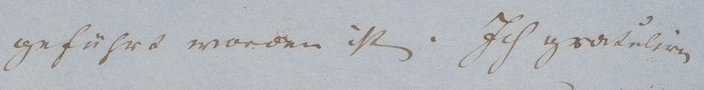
geführt worden ist. Ich gratulire
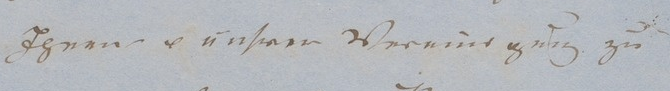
Ihnen & unsrer Vereinigung zu
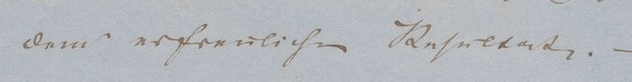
dem erfreulichen Resultate. –
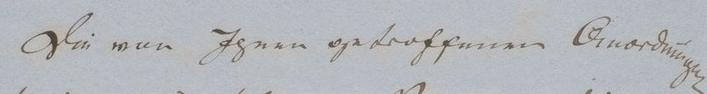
Die von Ihnen getroffenen Anordnungen
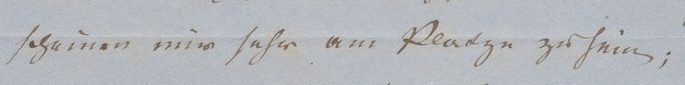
scheinen mir sehr am Platze zu sein;
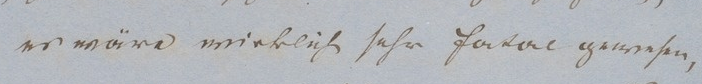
es wäre wirklich sehr fatal gewesen,
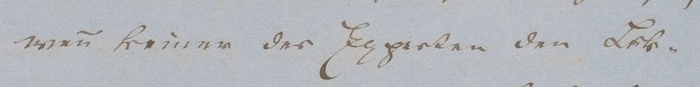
wenn keiner der Experten den Luk-
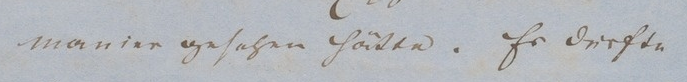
manier gesehen hätte. Es dürfte
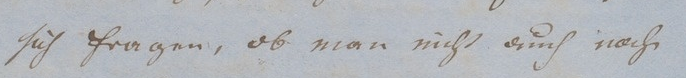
sich fragen, ob man nicht auch noch
